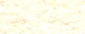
die
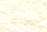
ein
